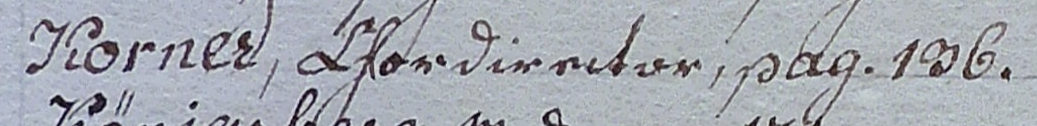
Korner, Chordirector, pag. 136.
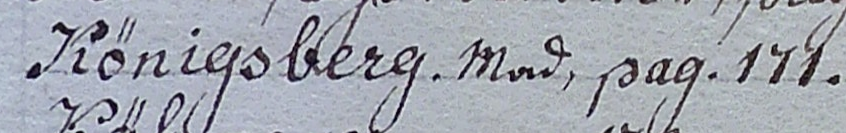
Königsberg, Mad, pag. 171.
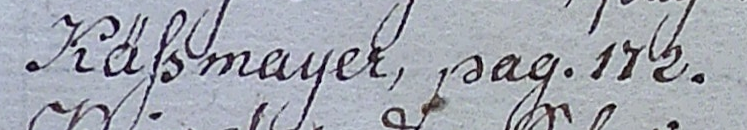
Kässmayer, pag. 172.
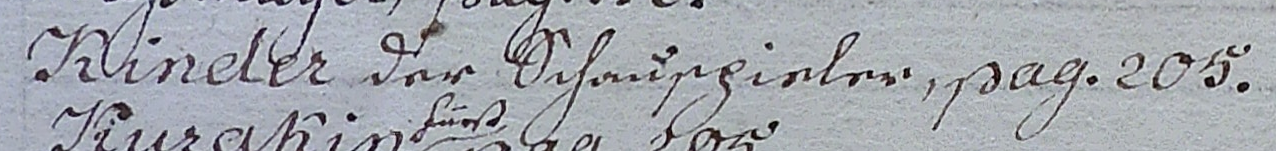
Kinder der Schauspieler, pag. 205.
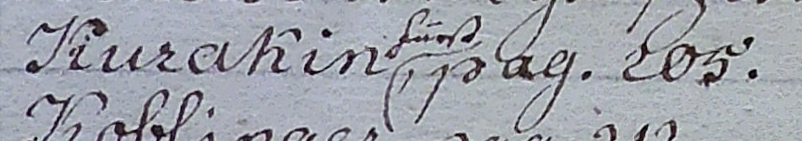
KurakinFürst, 205.
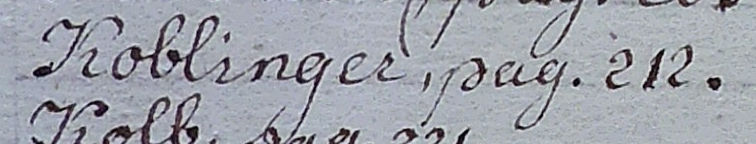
Koblinger, pag. 212.
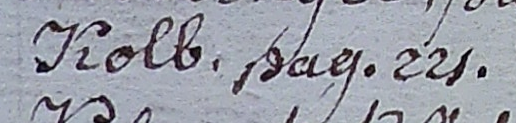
Kolb. pag. 221.
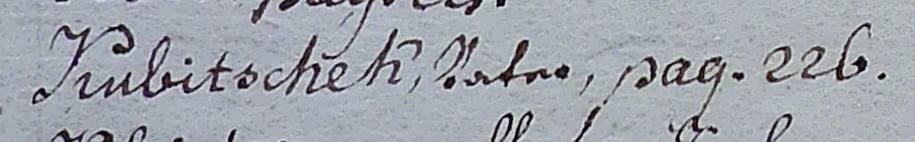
Kubitschek, Vater, pag. 226.
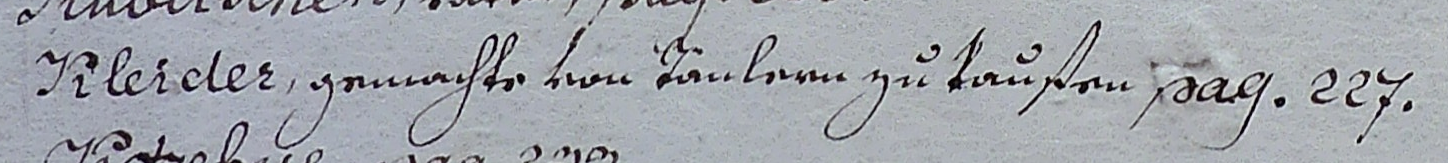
Kleider, gemachte von Tänlern zu kaufen pag. 227.
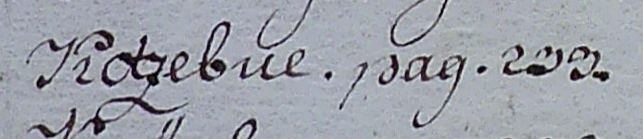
Kotzebue. pag. 233.
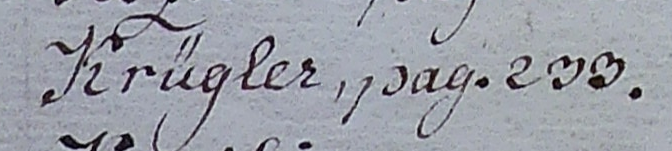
Krügler, pag. 233.
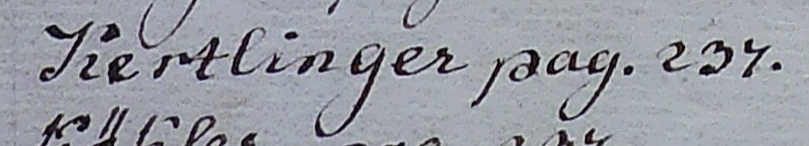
Kertlinger pag. 237.
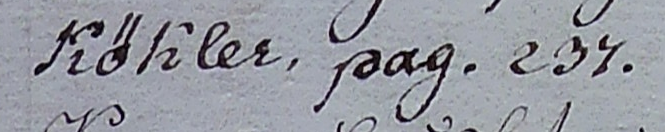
Köhler, pag. 237.
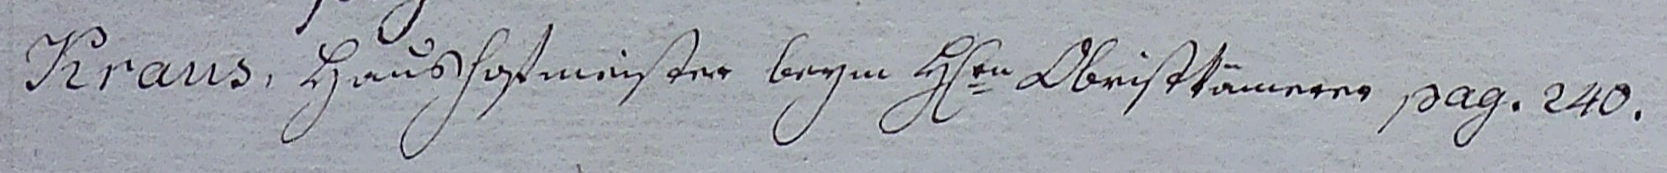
Kraus, Haushofmeister beym HEr͇n Obristkämerer pag. 240.
